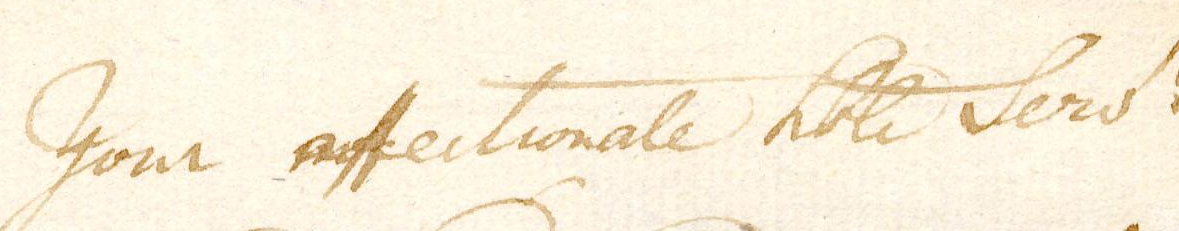Your affectionate hble Serv^t
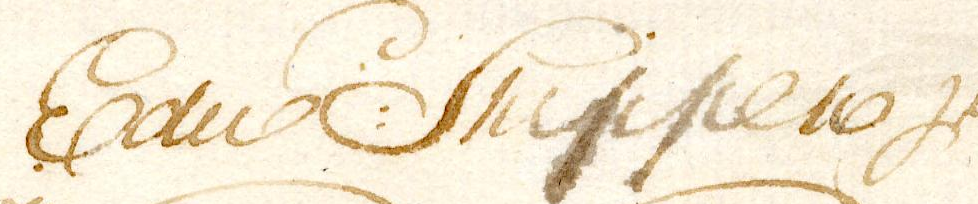Edw^d Shippen
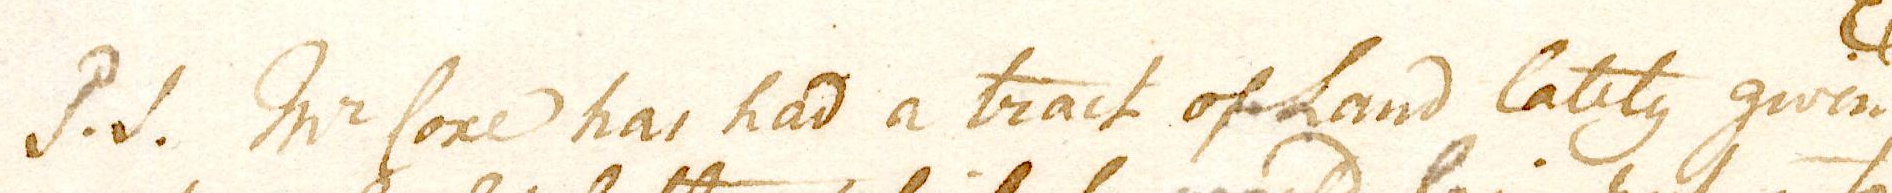P.S. M^r Coxe has had a trait of Land lately given
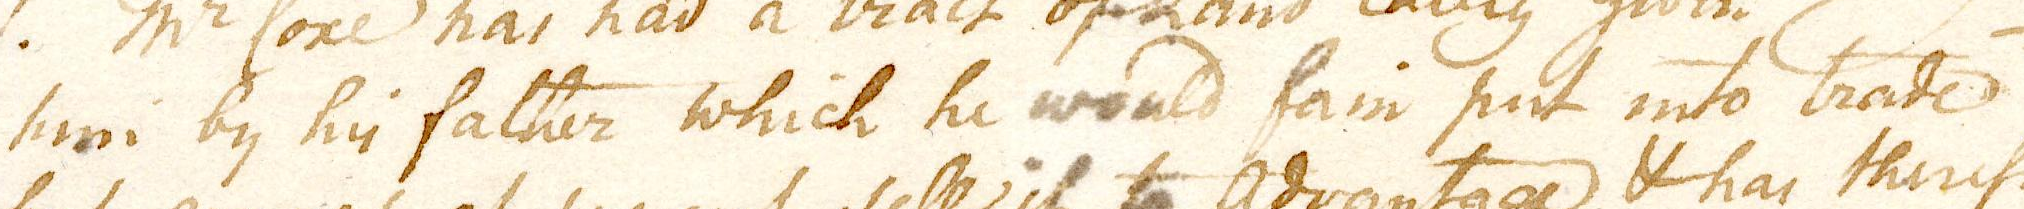him by his father which he would fain put into trade
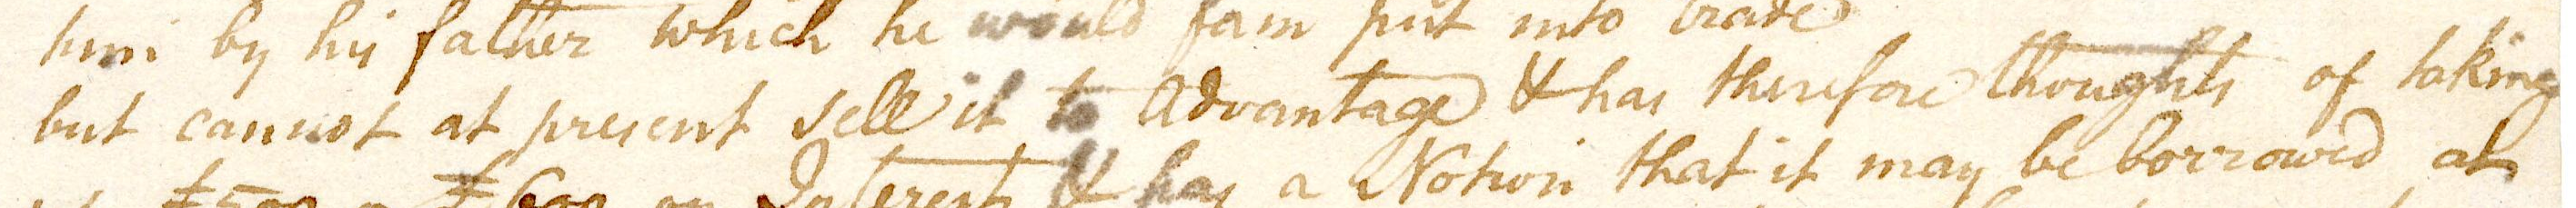but cannot at present sell it to Advantage & has therefore thoughts of taking
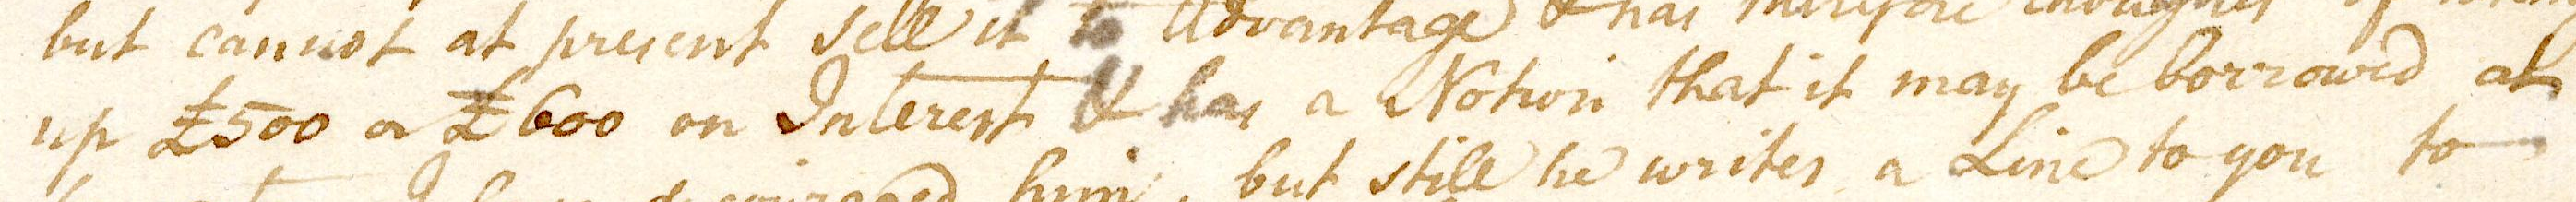up £500 or £600 on Interest & has a Notion that it may be borrowed at
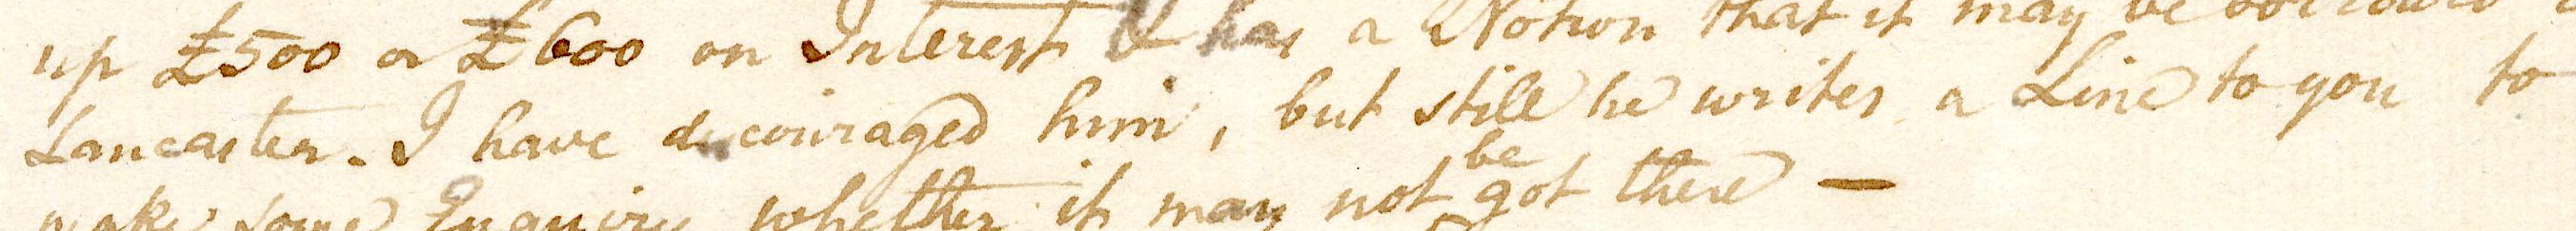Lancaster. I have discouraged him, but still he writes a Line to you to
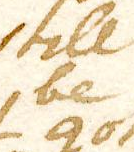be
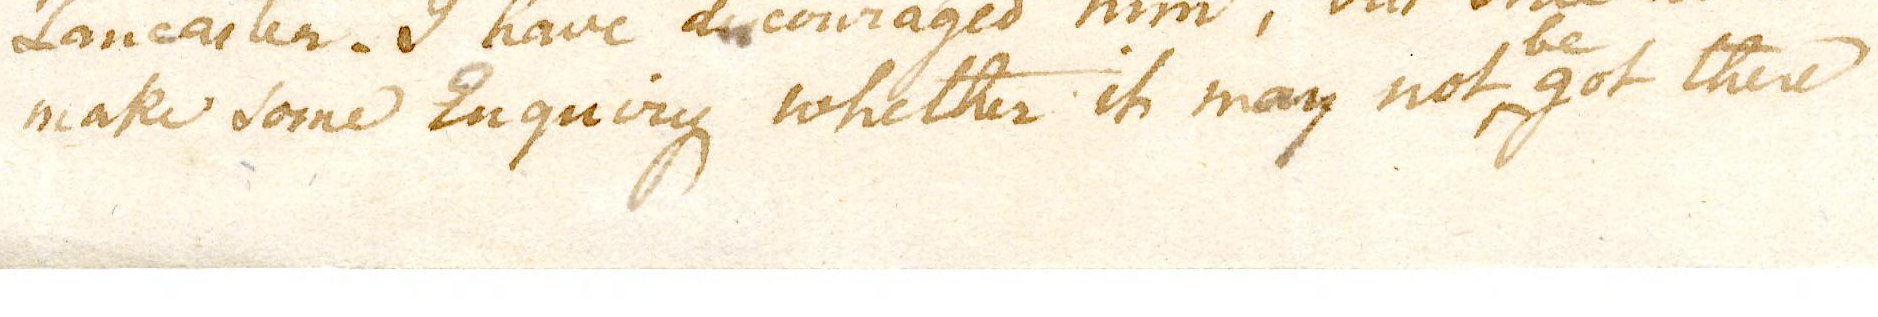make some Enquiry whether it may not ^ got there
